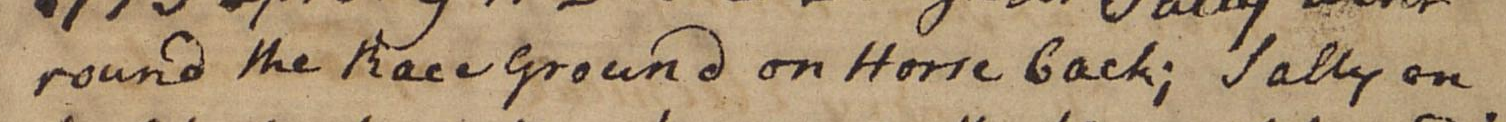round the Race Ground on Horse back; Sally on
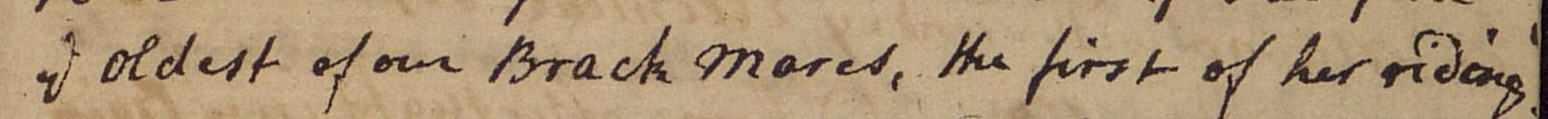y^e oldest of our Brack Mares, the first of her riding
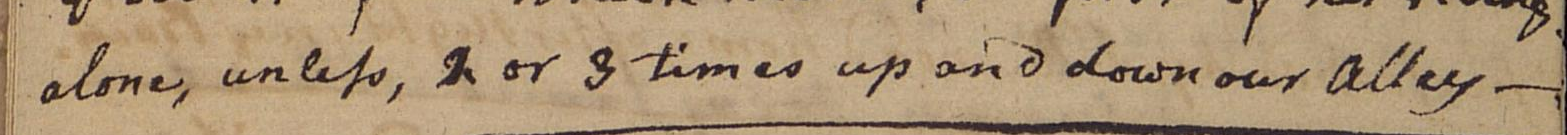alone, unless, 2 or 3 times up and down our Alley-
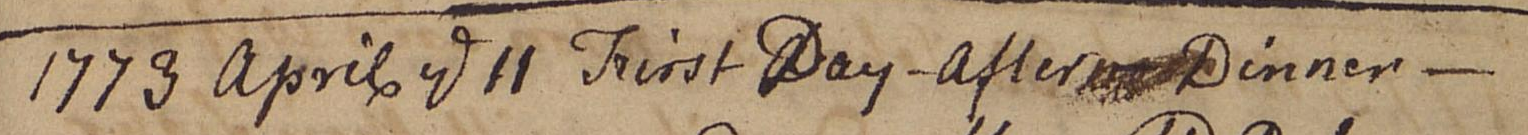1773 April y^e 11 First Day- After Dinner-
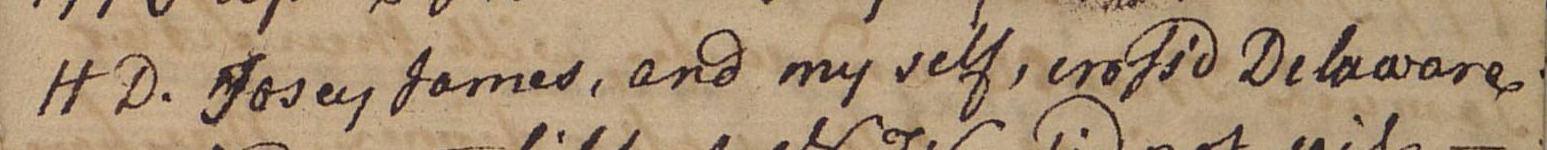HD. Josey James, and my self, cross'd Delaware
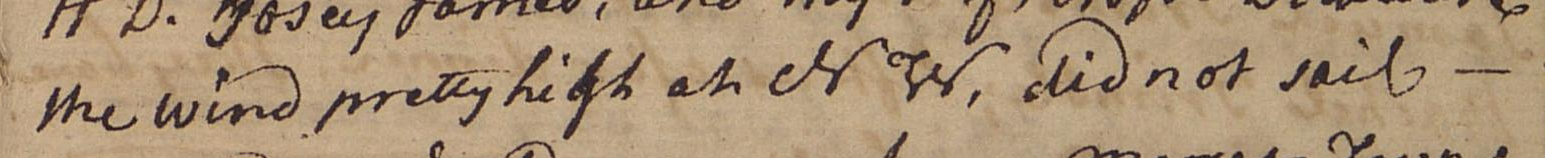the wind pretty high at NW, did not sail-
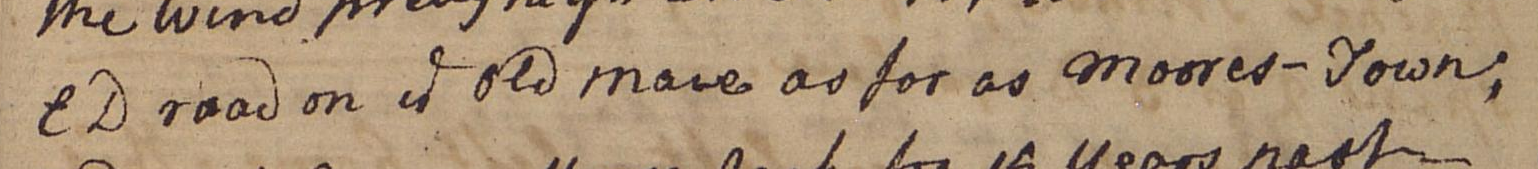ED road on y^e old mare as for as Moores-Town,
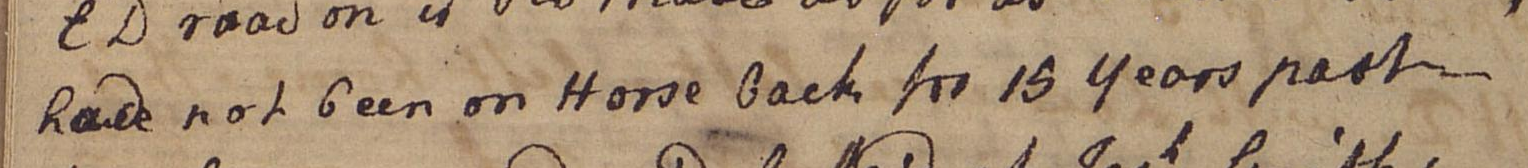[had] not been on Horse back for 15 years past-
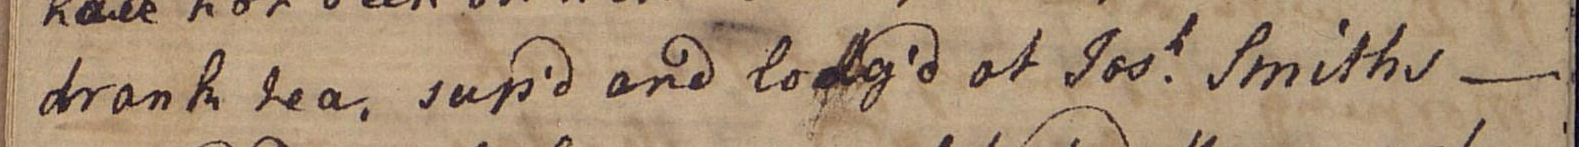drank tea, sup'd and loglg'd at Jos^l. Smiths-
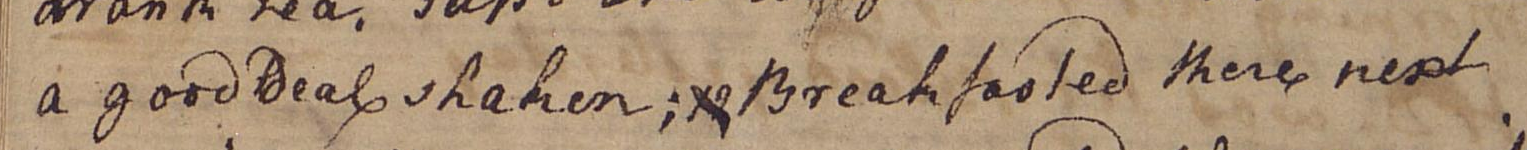a good Deal shaken; [__] Breakfasted there next
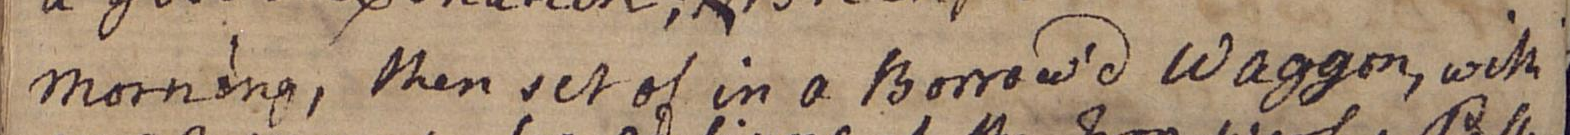Morning, then set of in a Borrow'd Waggon, with
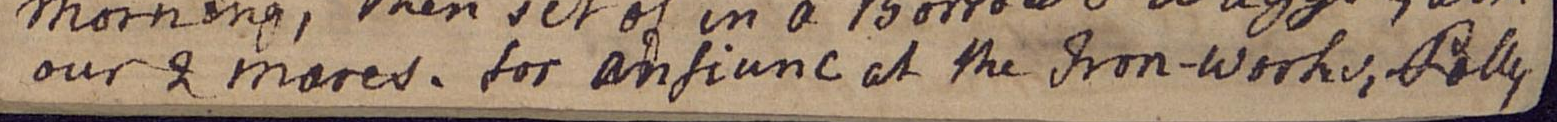our 2 mares. for ansiunc at the Iron works, Polly
